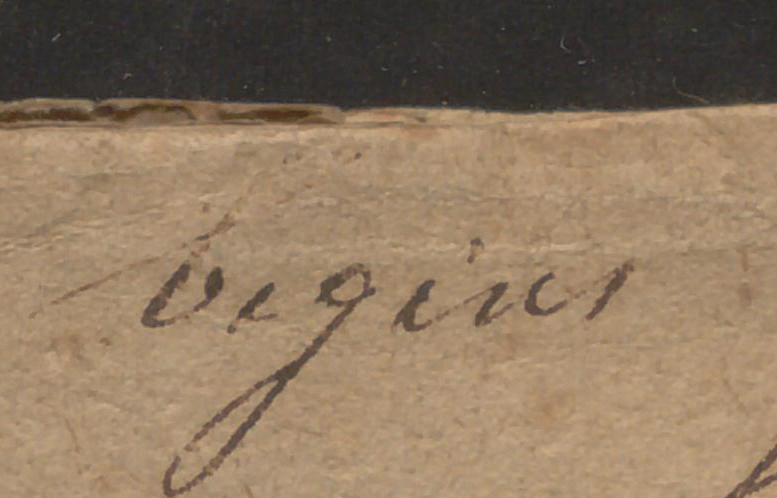begins
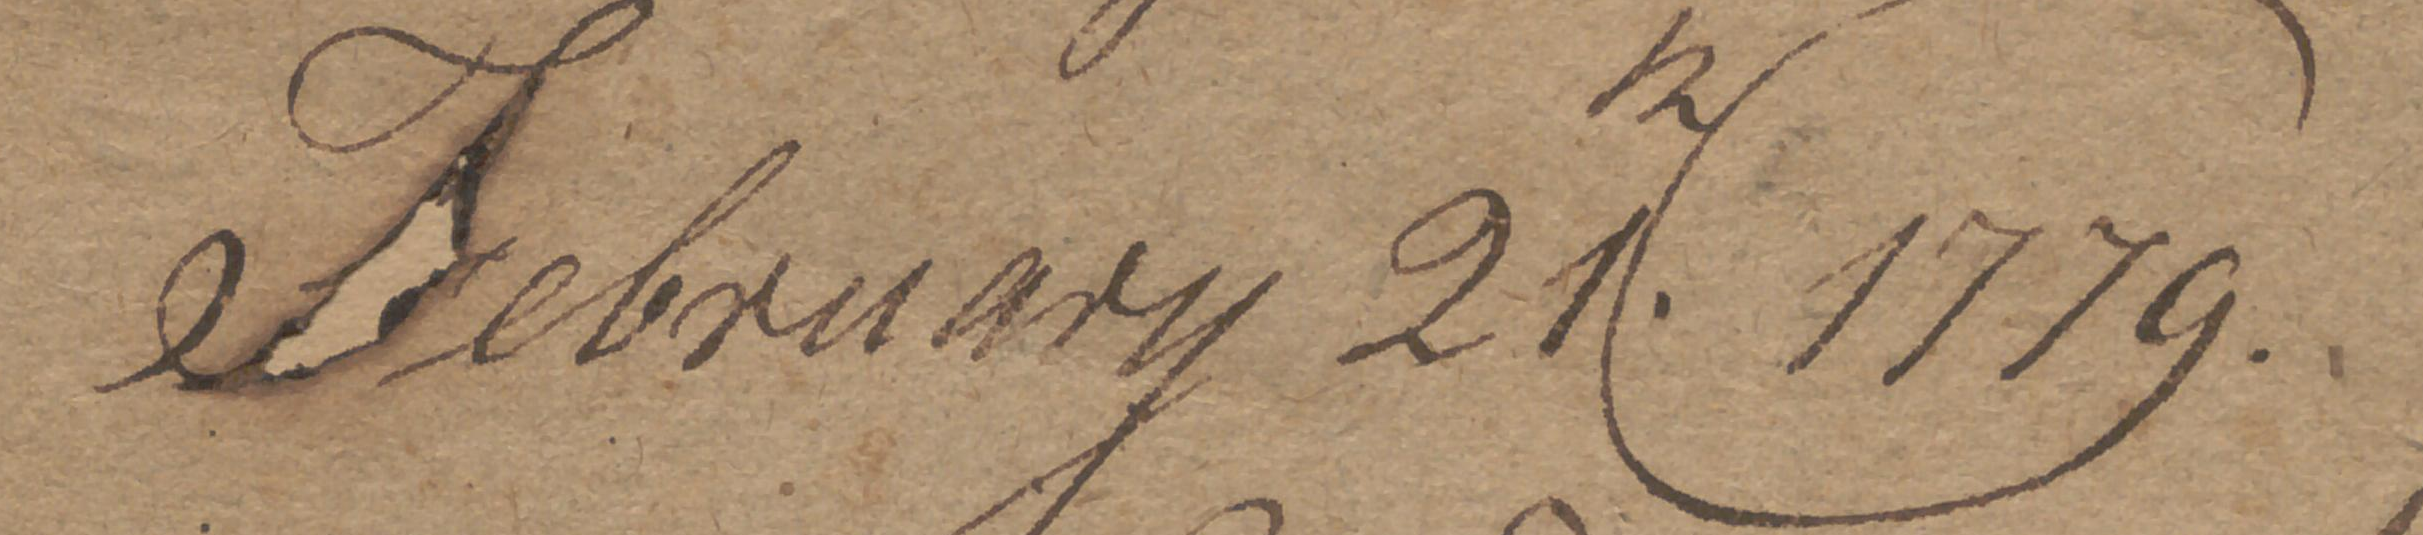February 21^th. 1779.
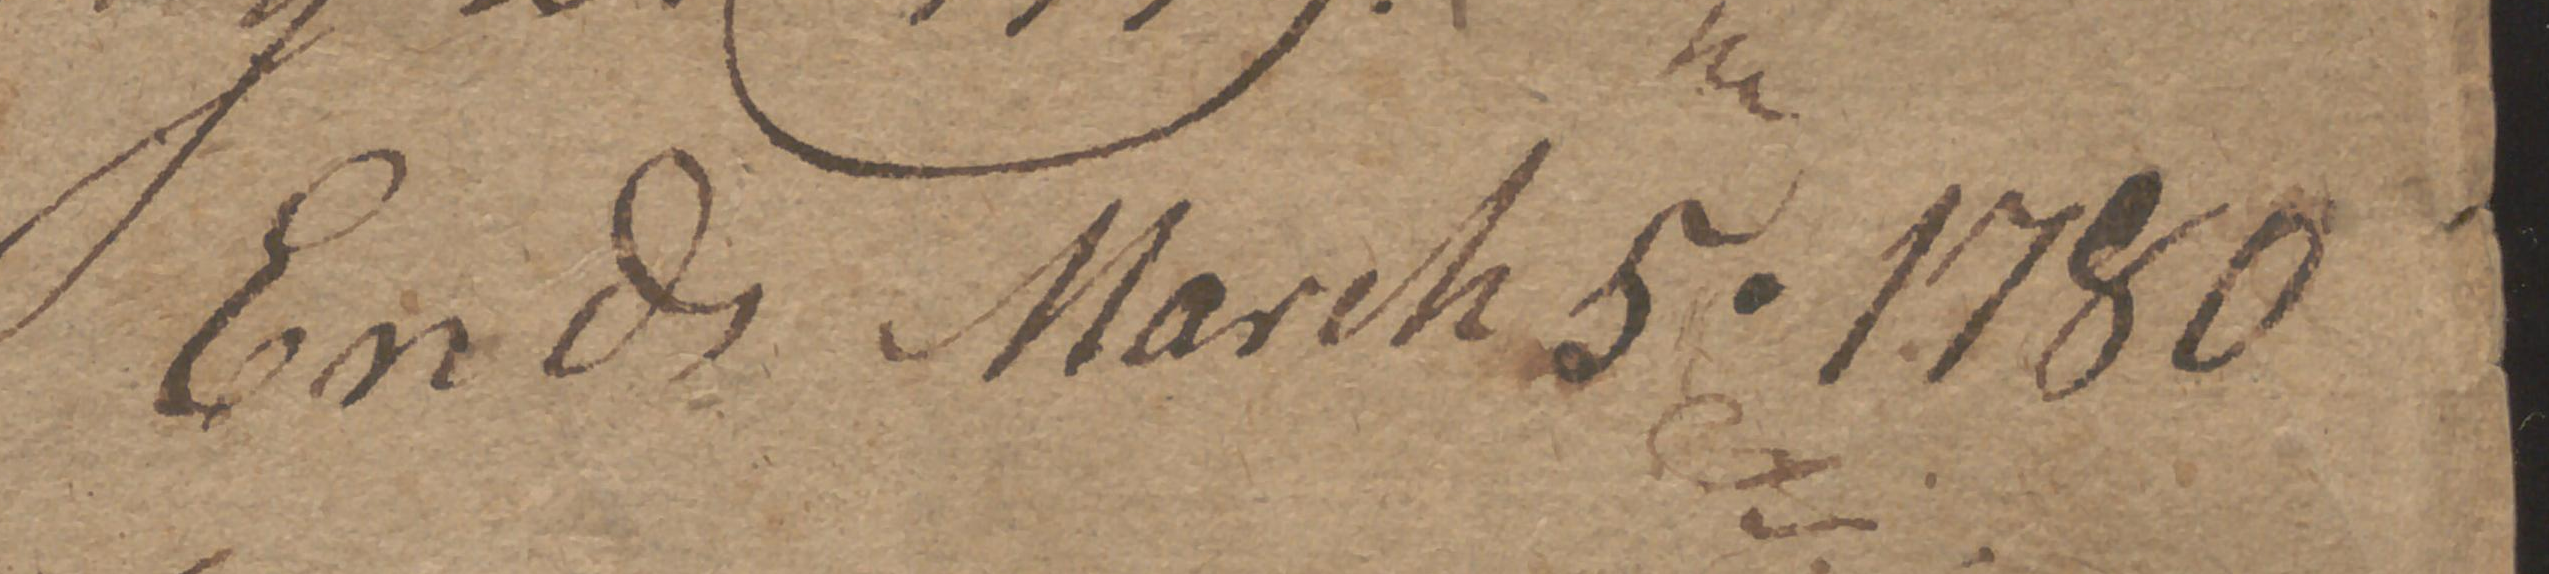Ends March 5^th. 1780
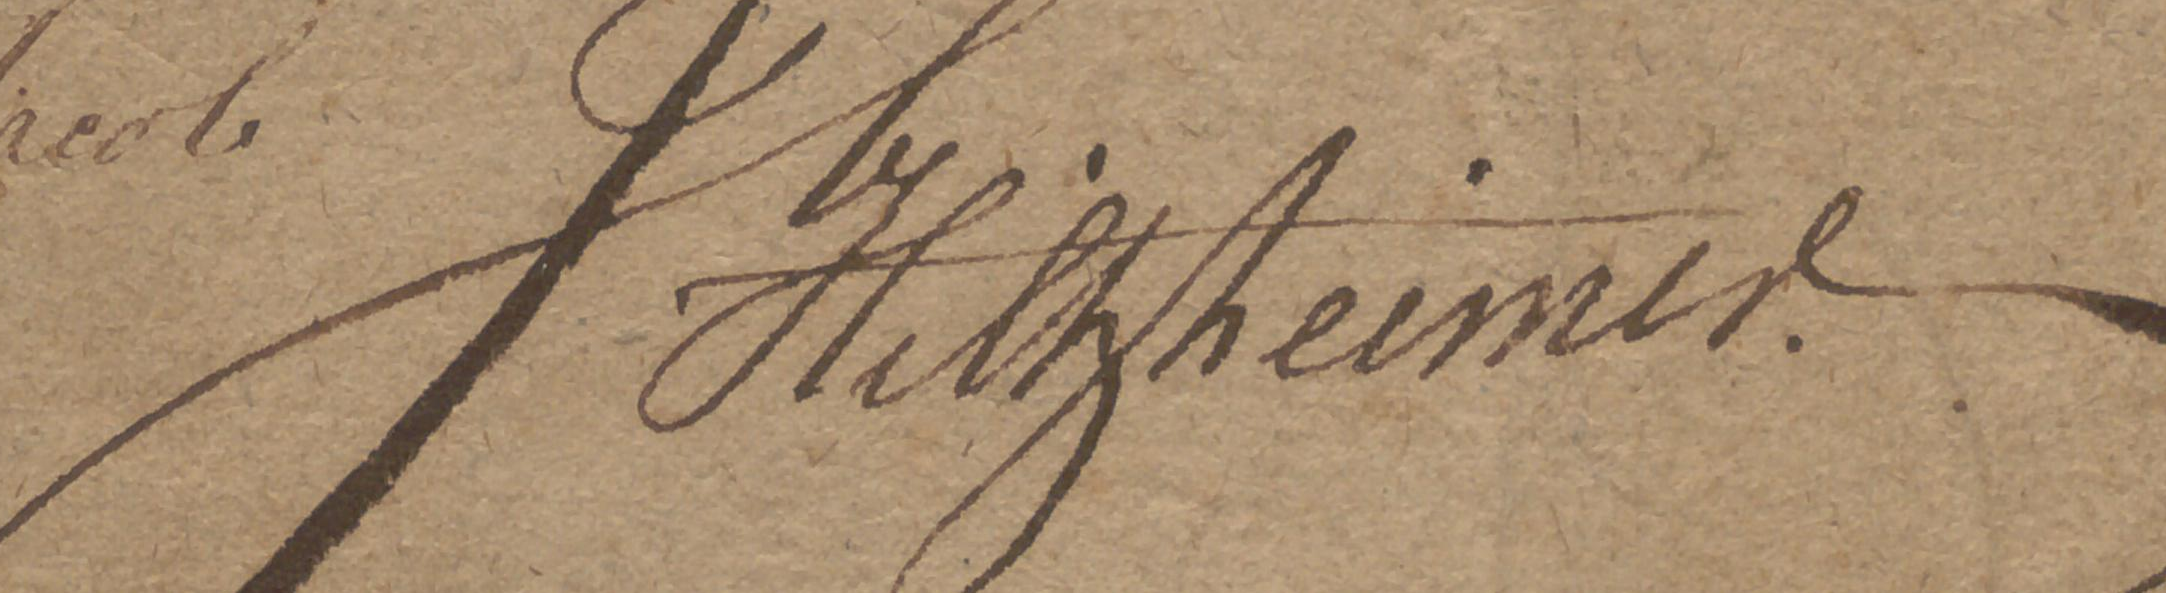J^b Hiltzheimer.
